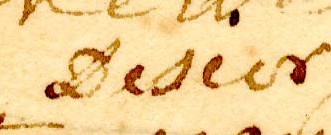Desire
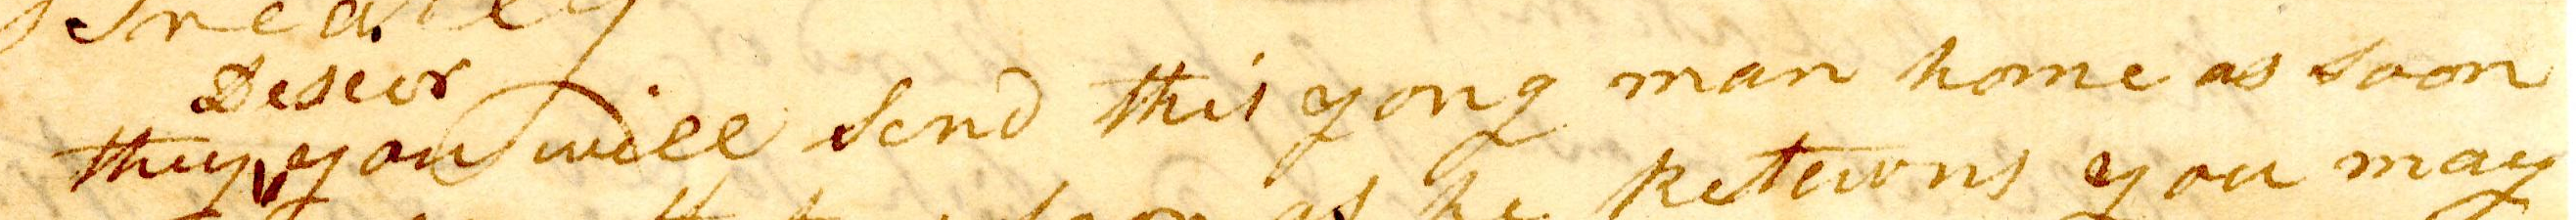they ^ you will Send this yong man home as soon
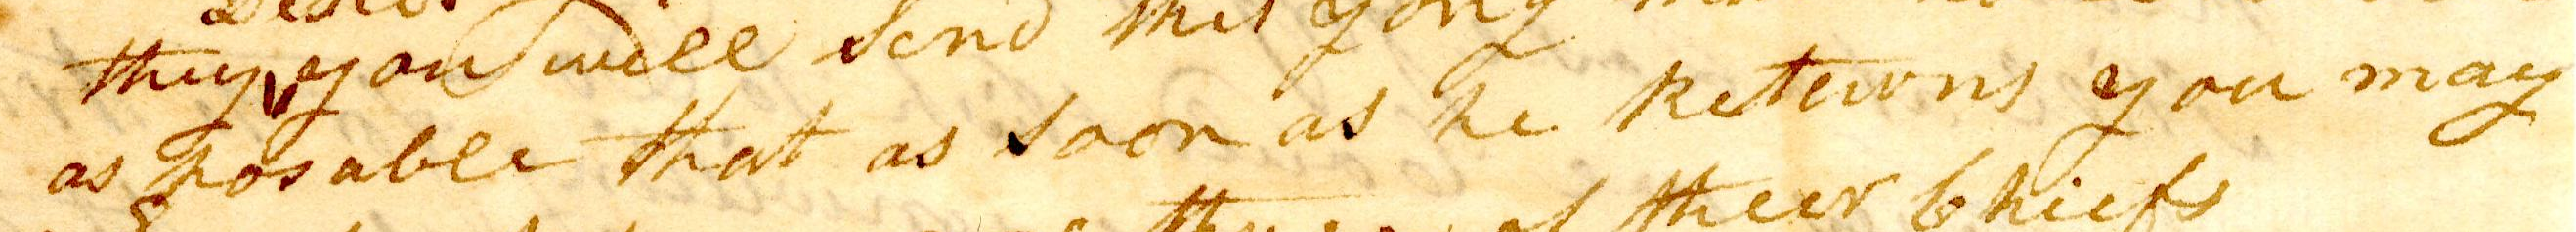as posable that as soon as he Returns you may
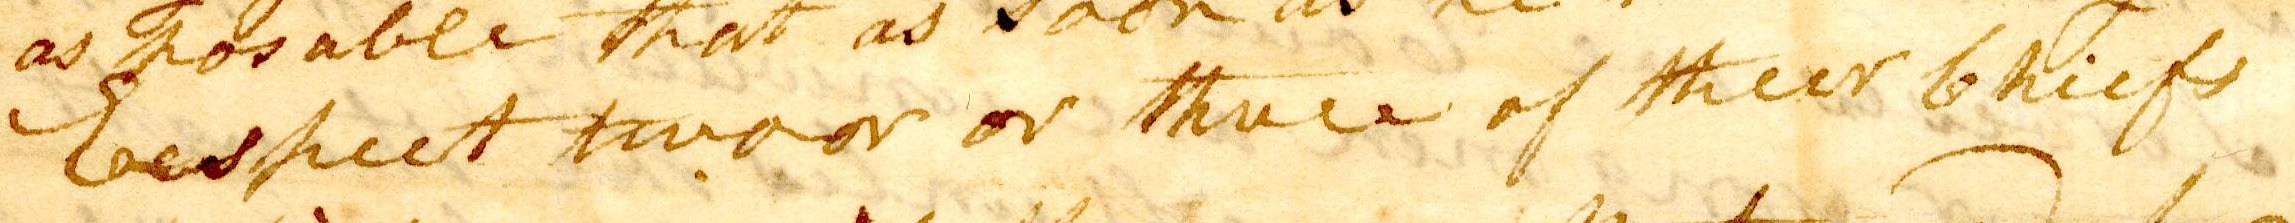Ecspect two or or three of their Chiefs
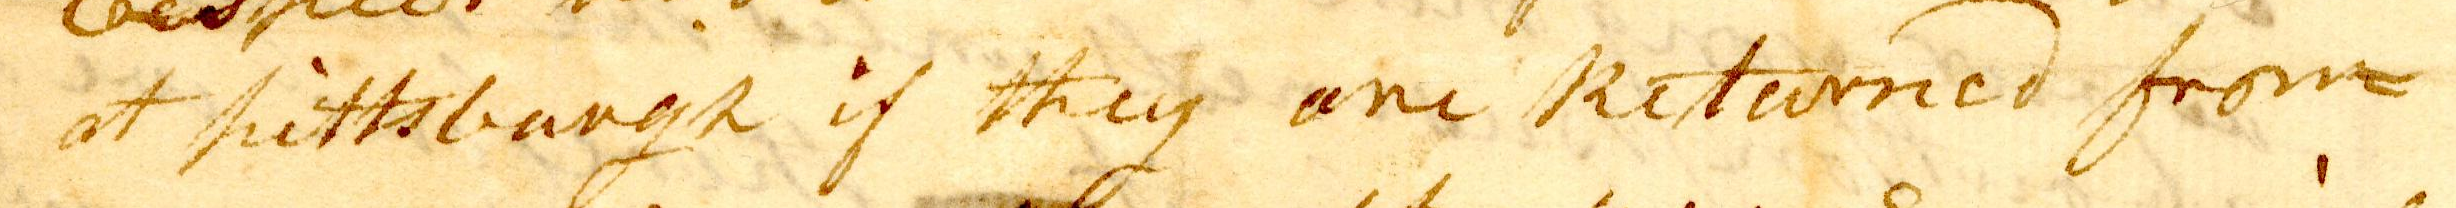at pittsburgh if they are Returned from
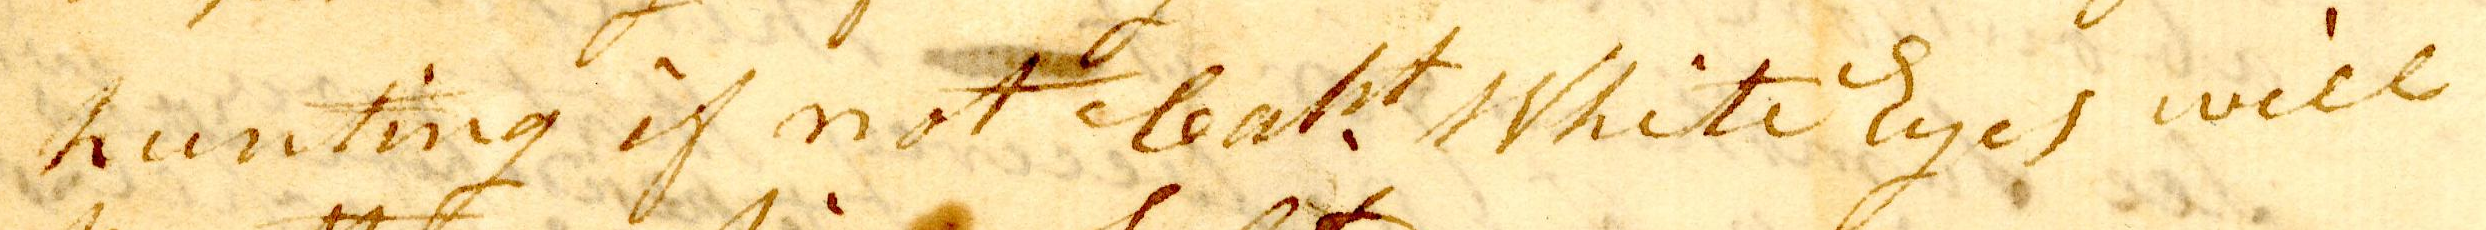hunting if not Cap^t. White Eyes will
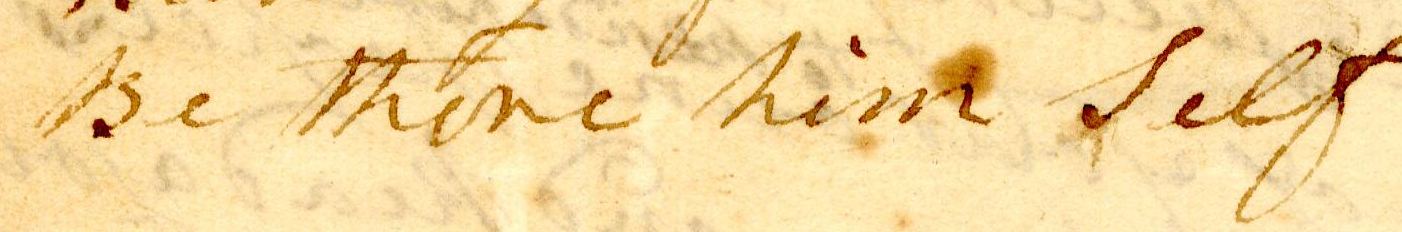Be there him Self
